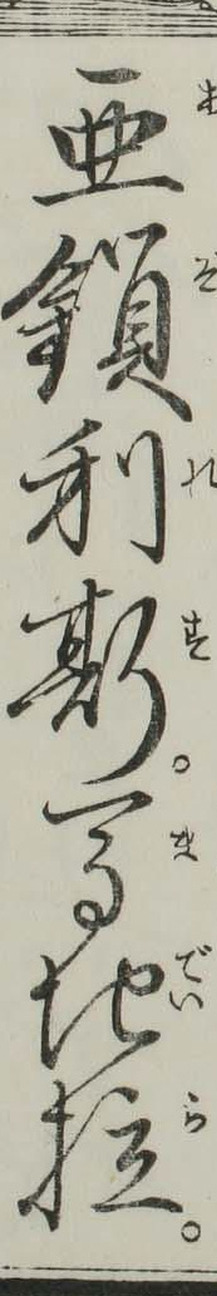亜鎖利斯。馬地拉。

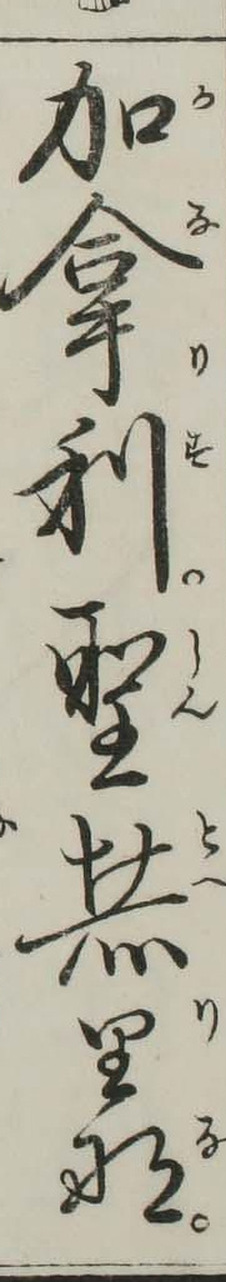加拿利。聖赫里那。
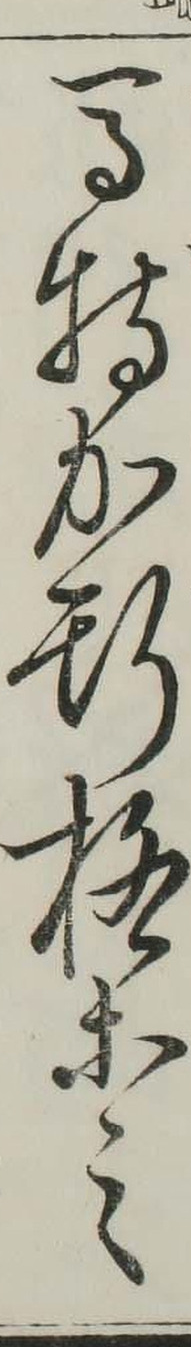馬特加斯格。等之
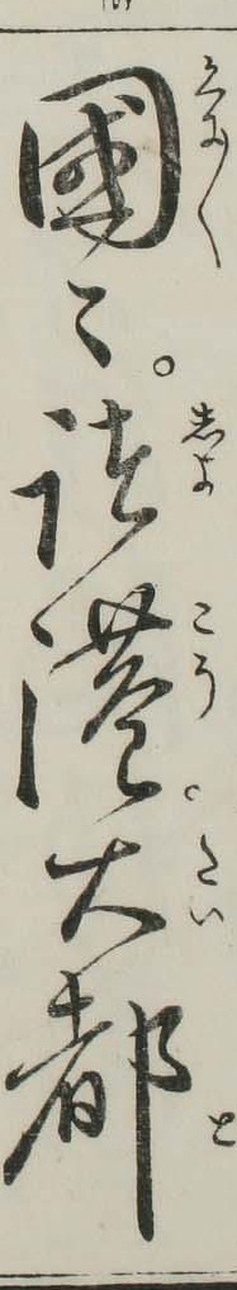国々。諸港。大都
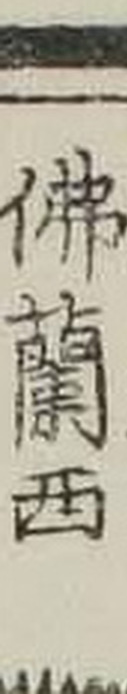仏蘭西
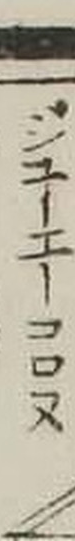ジユーエーコロヌ
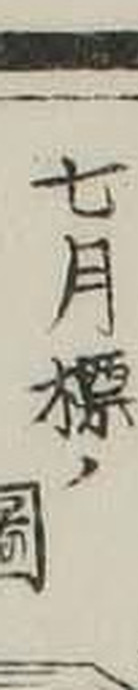七月標ノ図
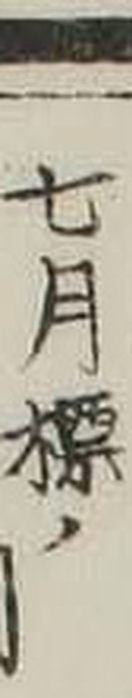七月標ノ図
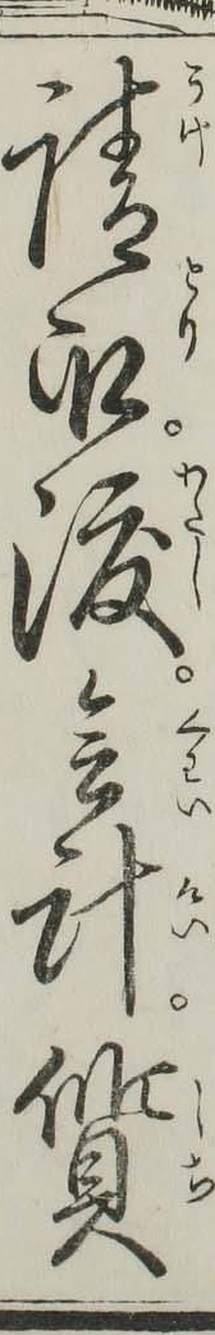請取。渡。会計。質
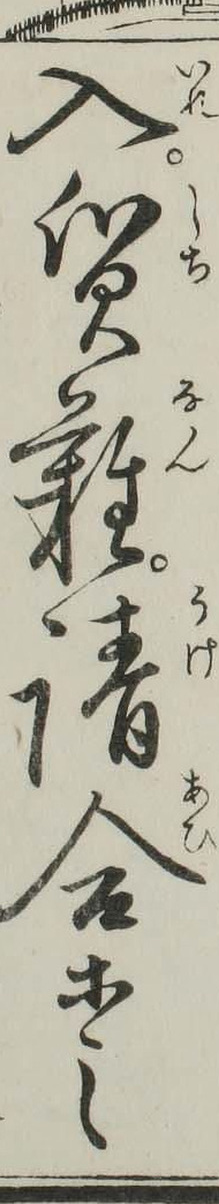入。質難。請合等之

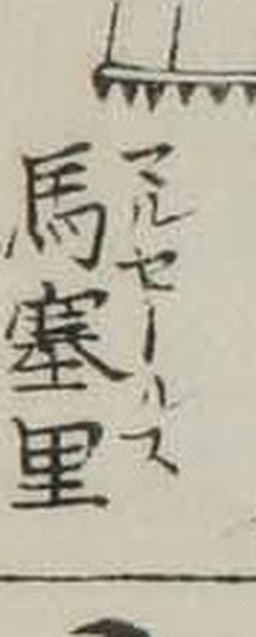馬塞里
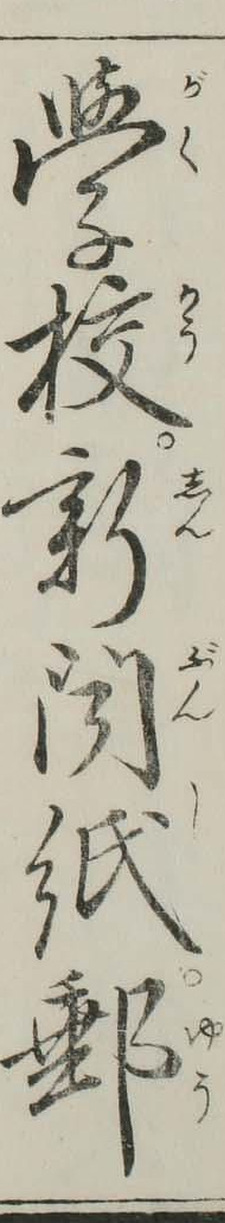学校。新聞紙。郵
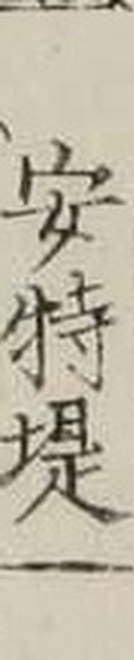安特堤
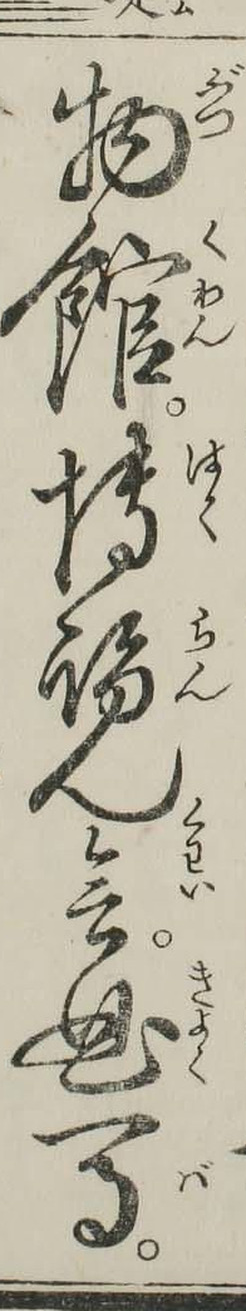物館。博覧会。曲馬。
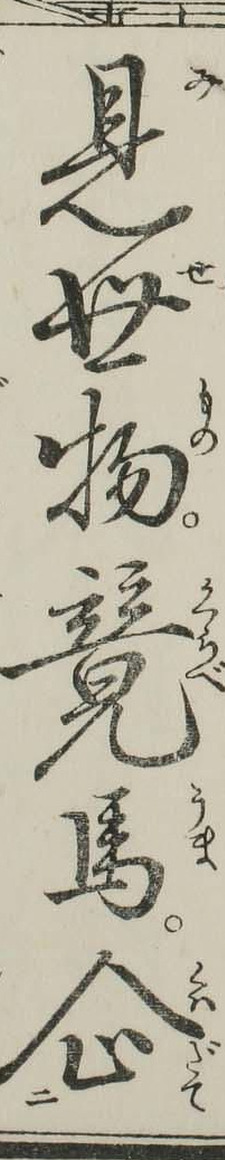見世物。競馬。企

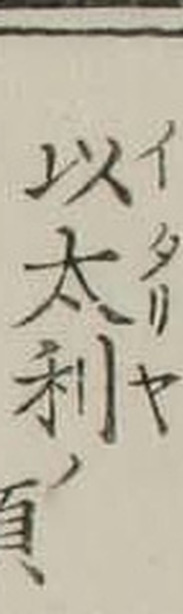以太利ノ領
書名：開化往来
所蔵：東京学芸大学教育コンテンツアーカイブ
